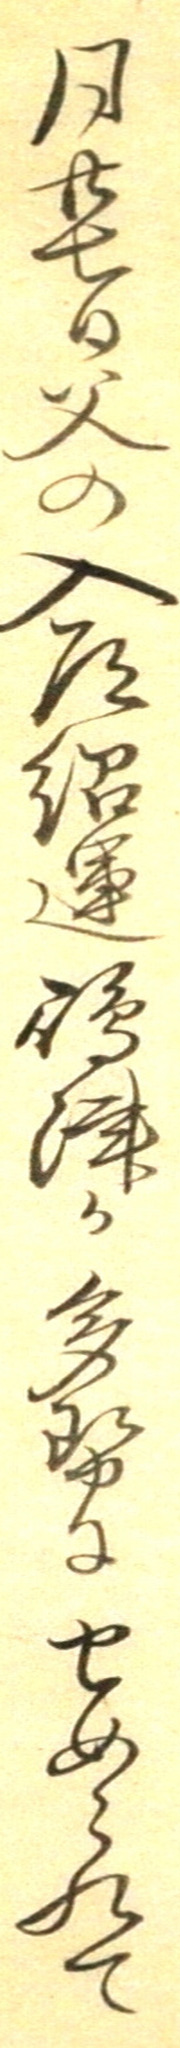月廿七日父の入道紹運島津か多勢にせめられて
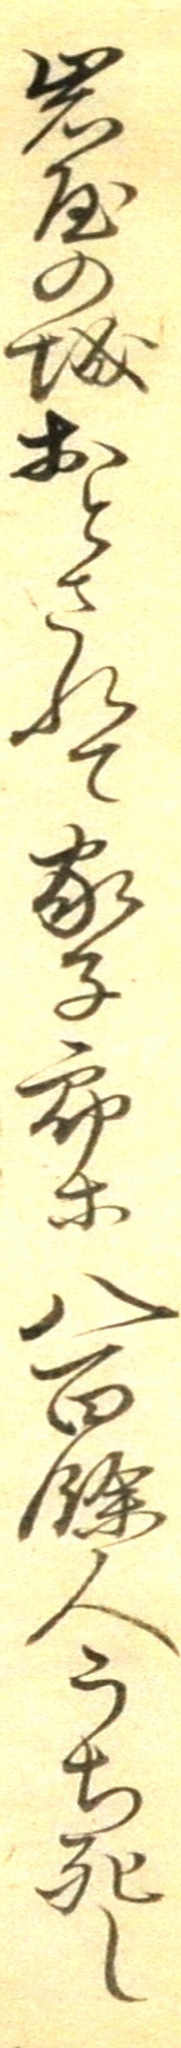岩屋の城おとされて家子郎等八百余人うち死し
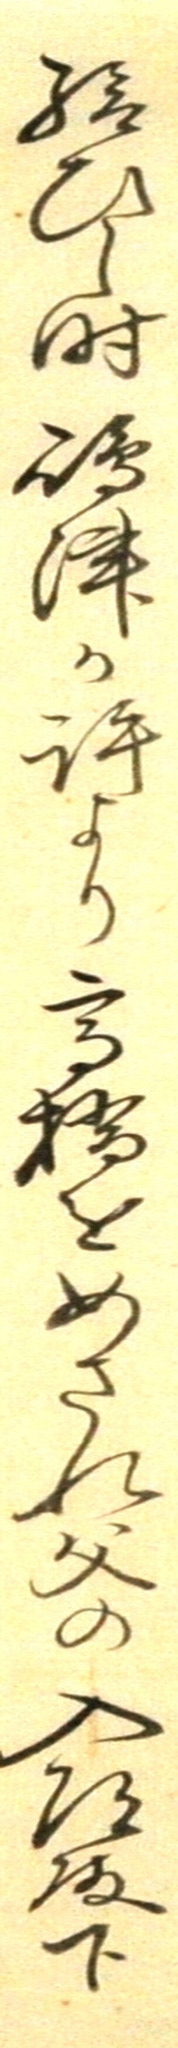給ひし時島津か許より高橋をめされ父の入道殿下
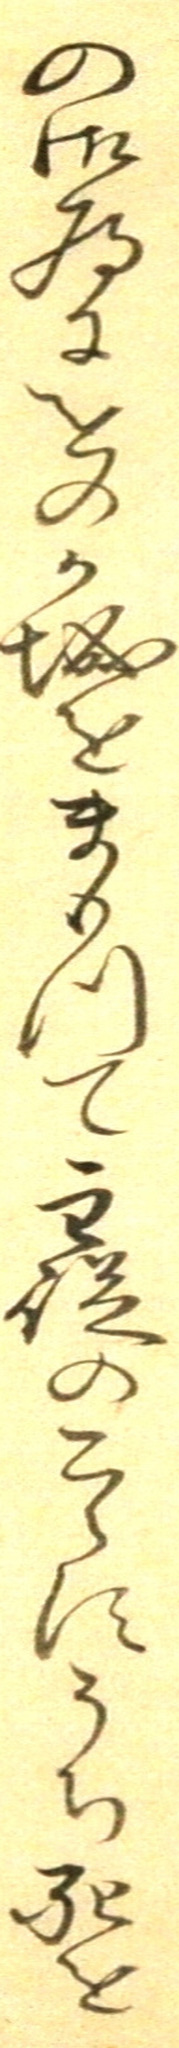の御為にをのか城をまもつて主従のこらすうち死を
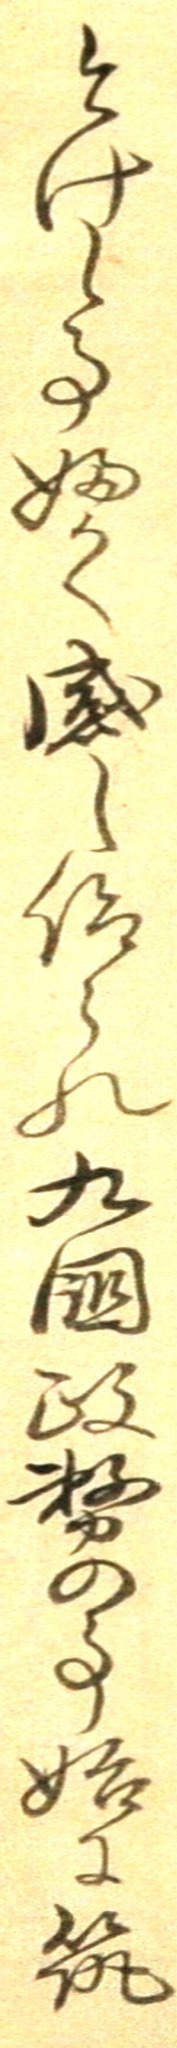とけし事ふかく感し仰られ九国政務の事始に築

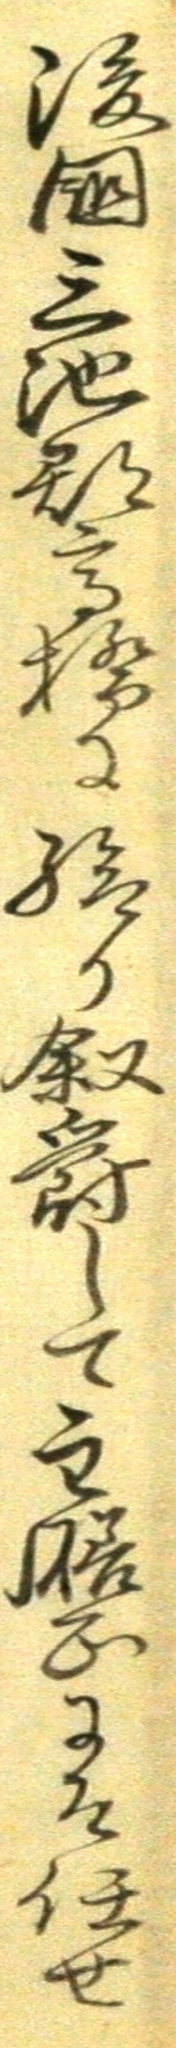後国三池郡高橋に給り叙爵して主膳正にそ任せ
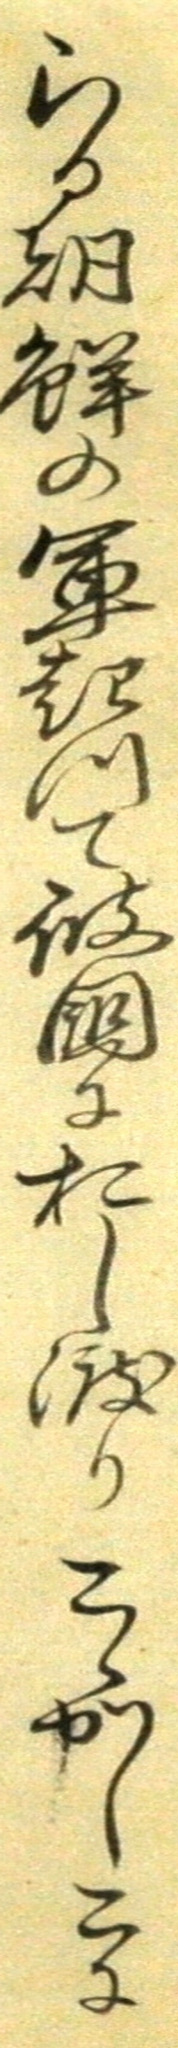らる朝鮮の軍起つて彼国におし渡りこゝかしこに
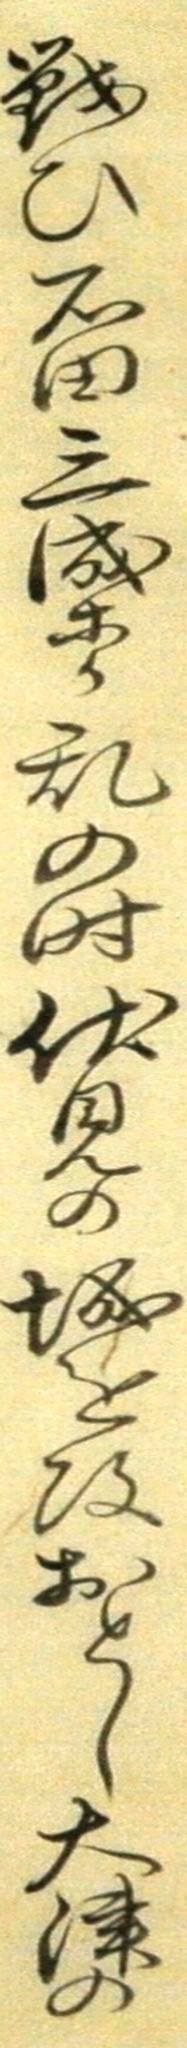戦ひ石田三成等か乱の時伏見の城を攻おとし大津の
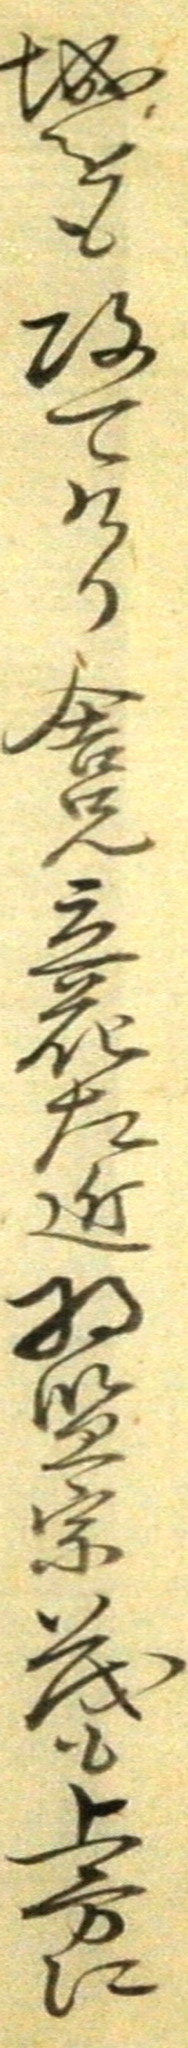城をも攻てけり舎兄立花左近将監宗茂も上方に
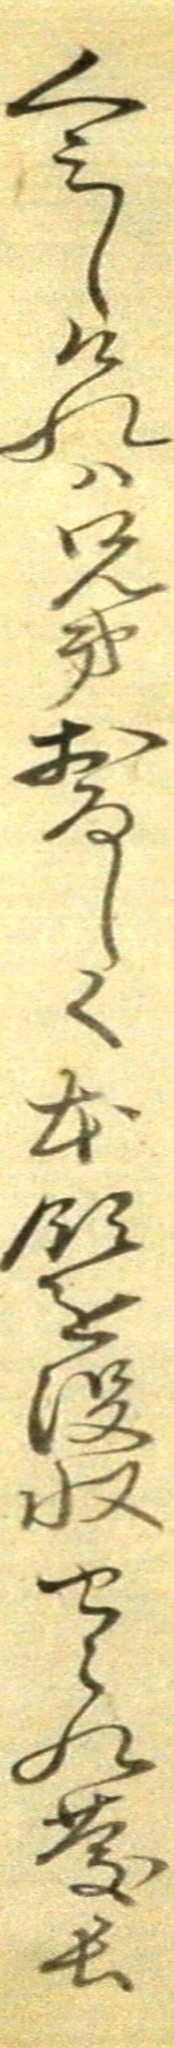くみしけれは兄弟おなしく本領を没収せられ慶長
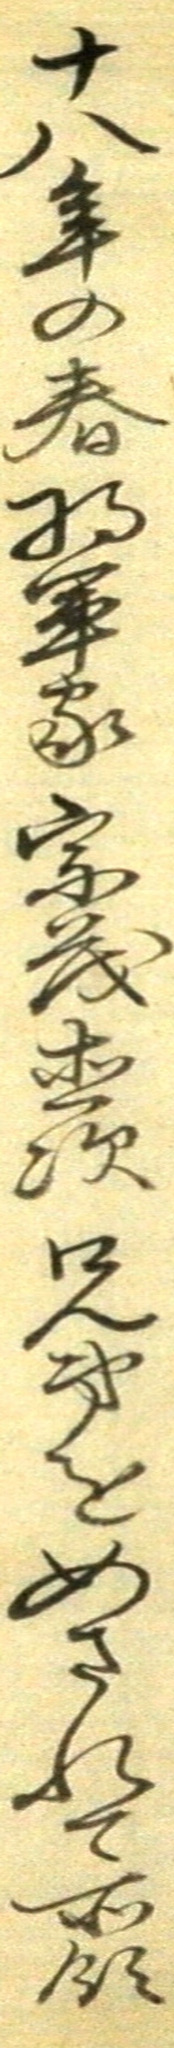十八年の春将軍家宗茂直次兄弟をめされて所領
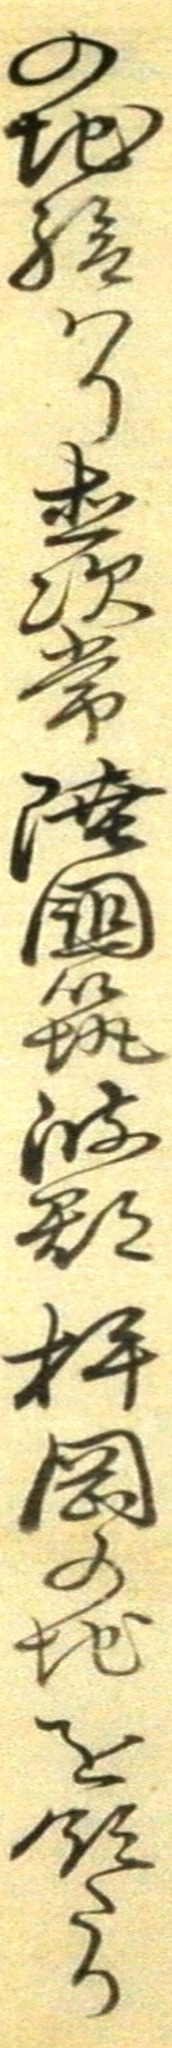の地給はり直次常陸国筑波郡柿岡の地を領たり
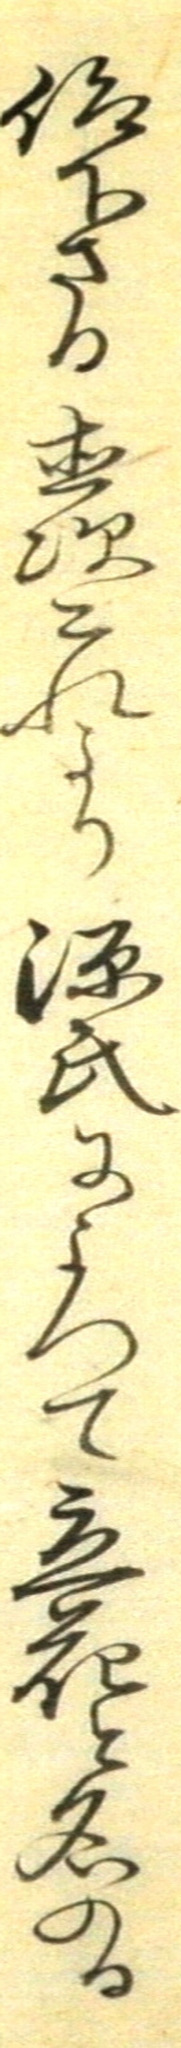仰下さる直次これより源氏よつて立花と名のる
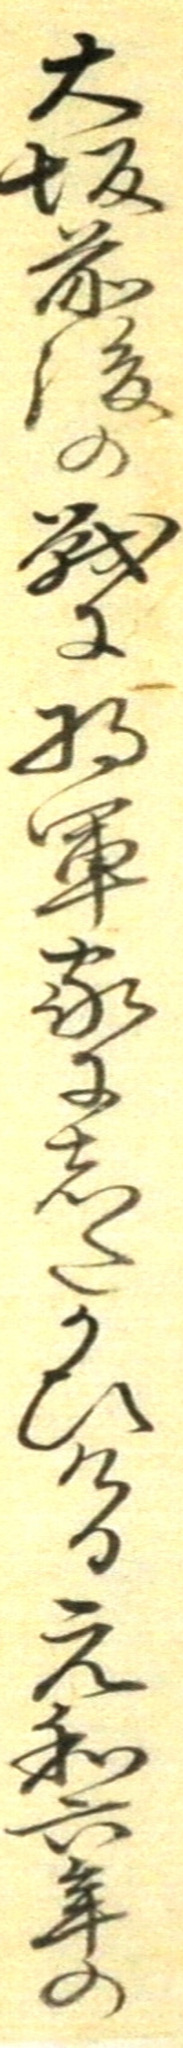大坂前後の戦に将軍家にしたかひける元和六年の
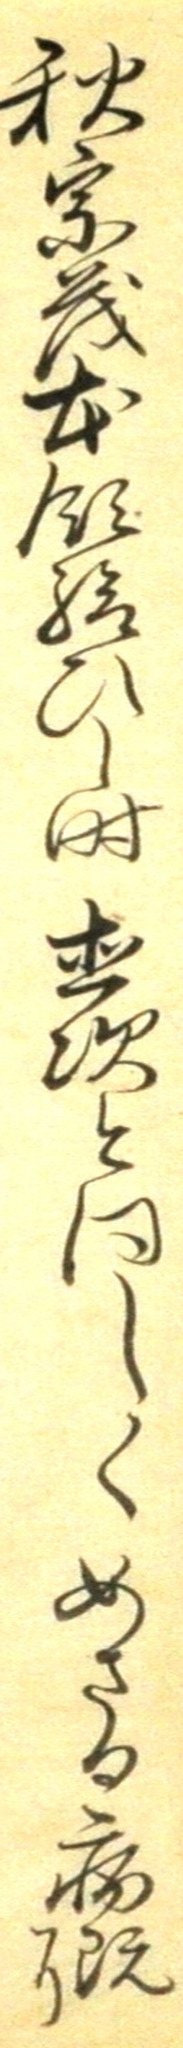秋宗茂本領給ひし時直次と同しくめさる病既に
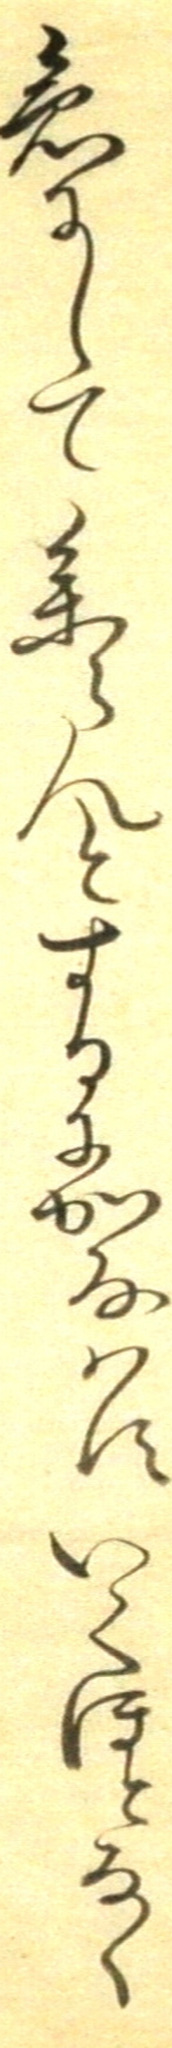急にして参らんとするにかなはすいくほとなく
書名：藩翰譜（八・下）
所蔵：伊那市立高遠町図書館・合同会社AMANE
